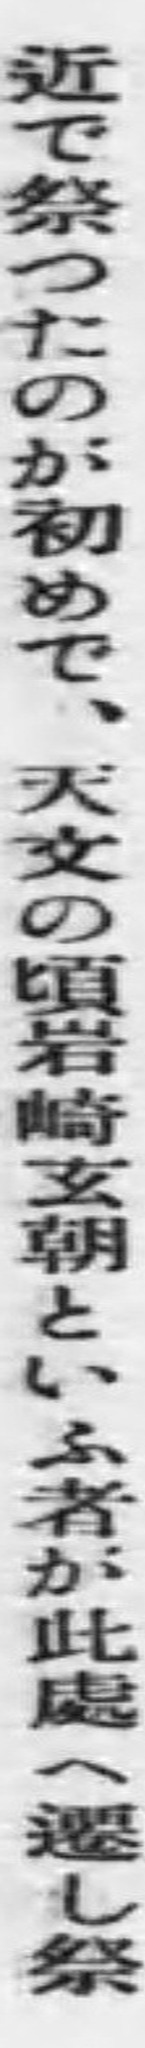近で祭つたのが初めで、天文の頃岩崎玄朝といふ者が此処へ遷し祭
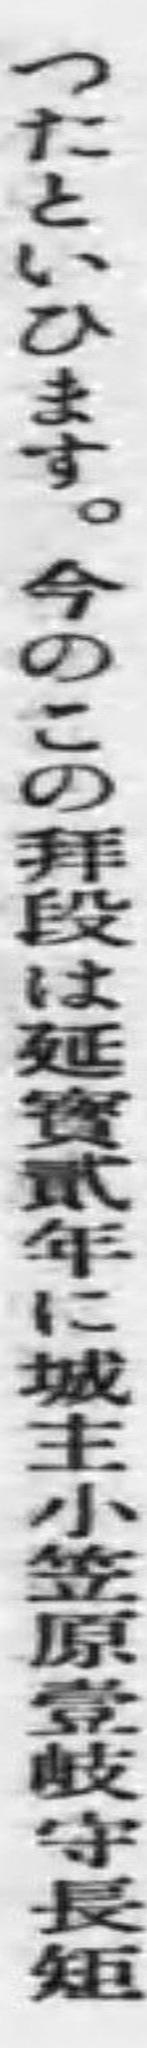つたといひます。今のこの拝段は延宝弐年に城主小笠原壱岐守長矩
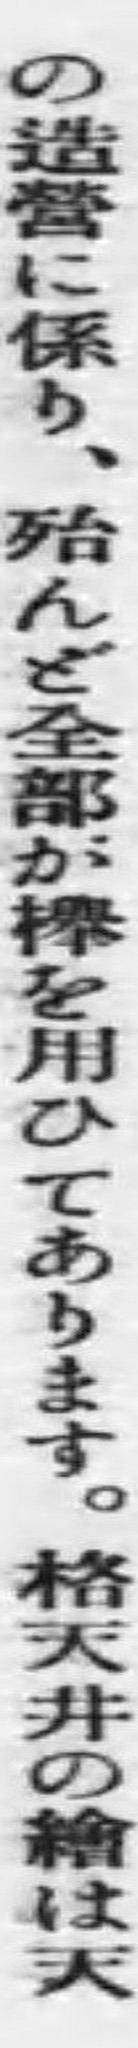の造営に係り、殆んど全部が欅を用ひてあります。格天井の絵は天

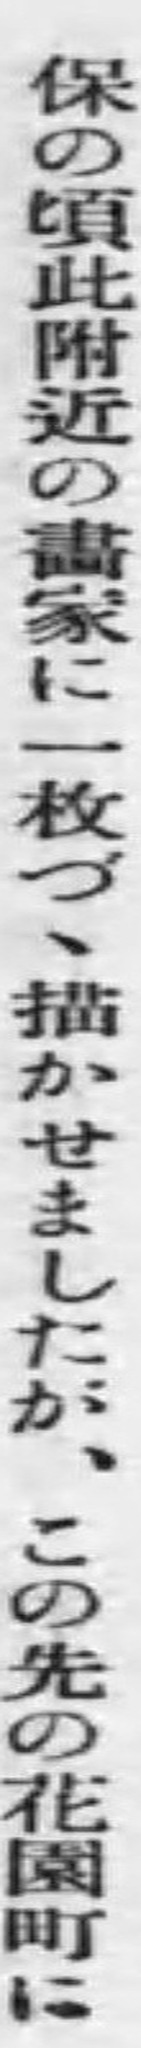保の頃此附近の画家に一枚づゝ描かせましたが、この先の花園町に
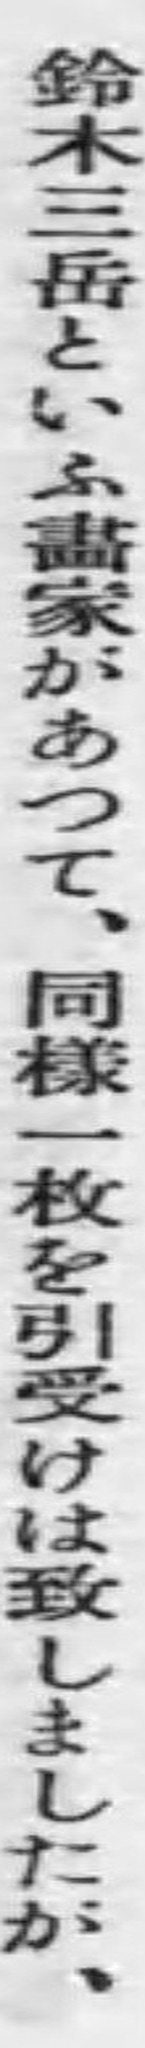鈴木三岳といふ画家があつて、同様一枚を引受けは致しましたが、
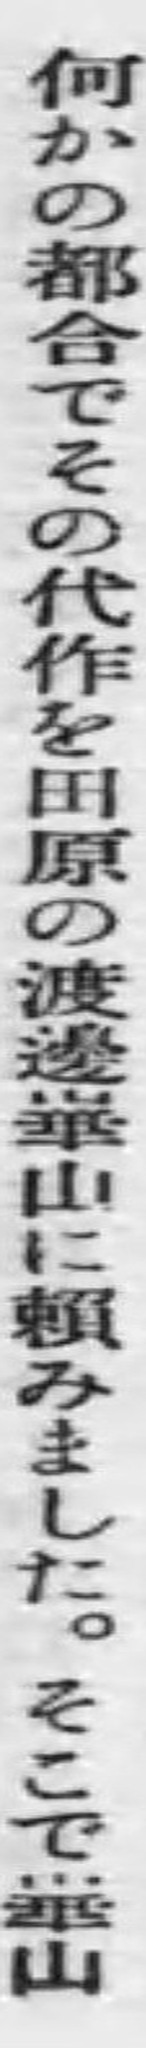何かの都合でその代作を田原の渡邊崋山に頼みました。そこで崋山
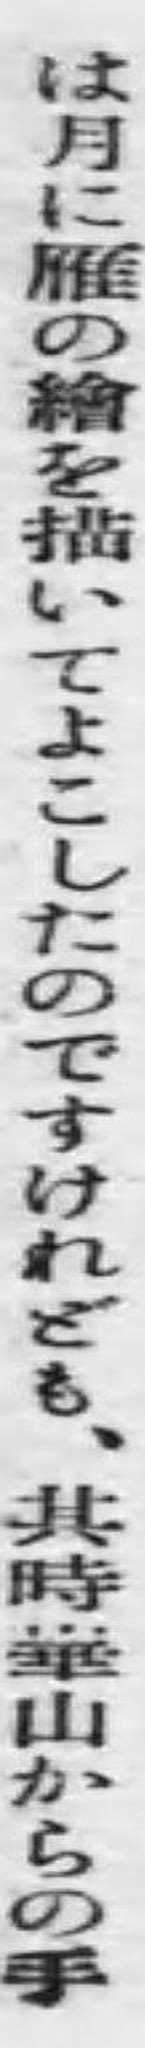は月に雁の絵を描いてよこしたのですけれども、其時崋山からの手
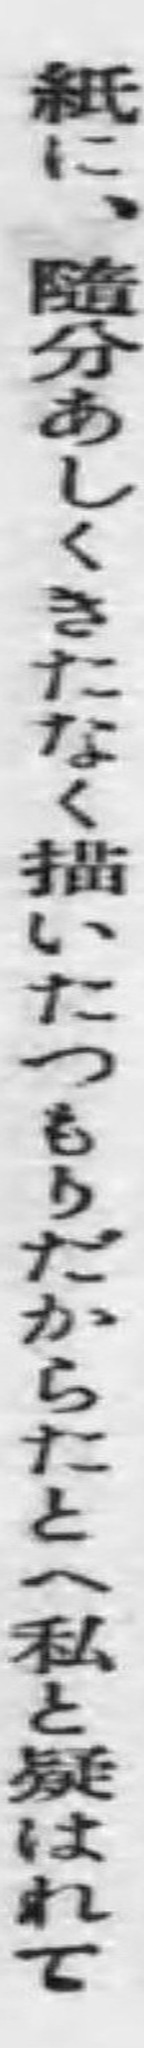紙に、随分あしくきたなく描いたつもりだからたとへ私と疑はれて
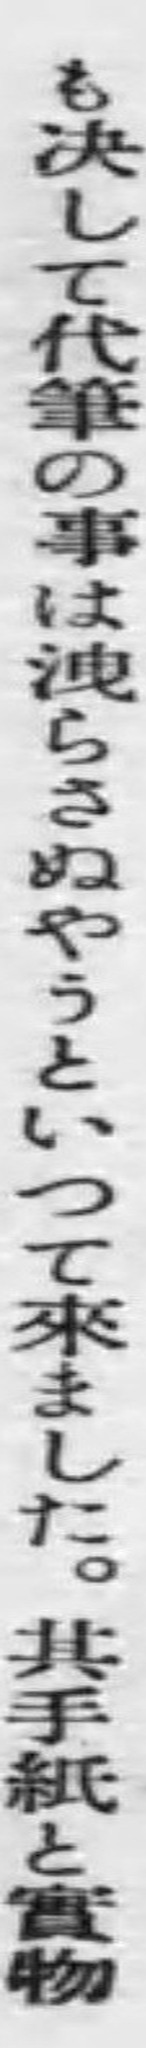も決して代筆の事は洩らさぬやうといつて來ました。其手紙と実物
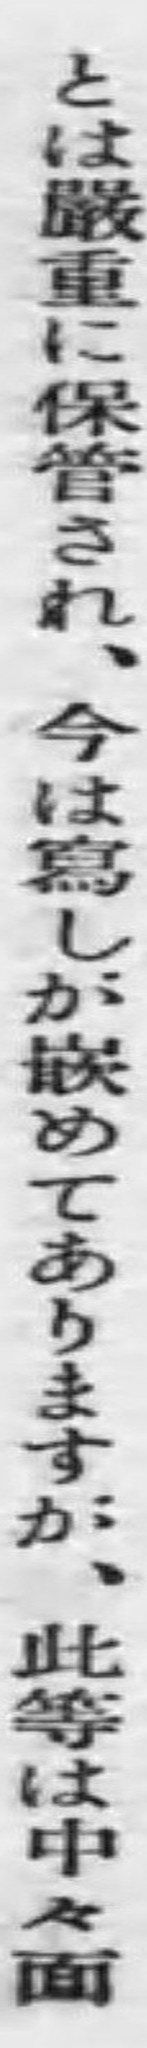とは厳重に保管され、今は写しが嵌めてありますが、此等は中々面
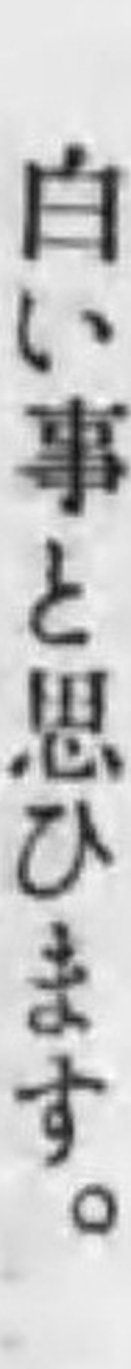白い事と思ひます。
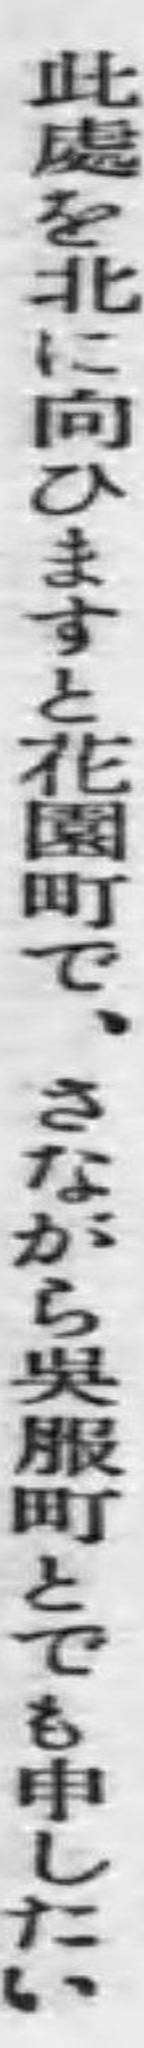此処を北に向ひますと花園町で、さながら呉服町とでも申したい
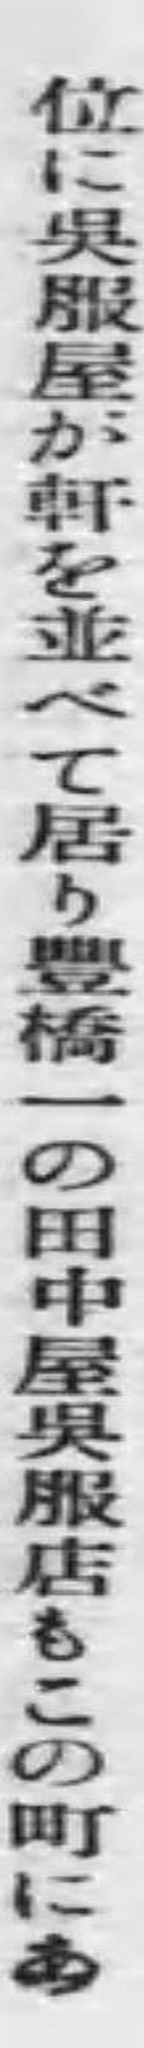位に呉服屋が軒を並べて居り豊橋一の田中屋呉服店もこの町にあ
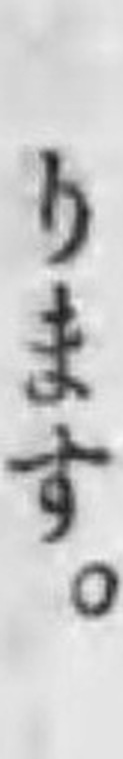ります。
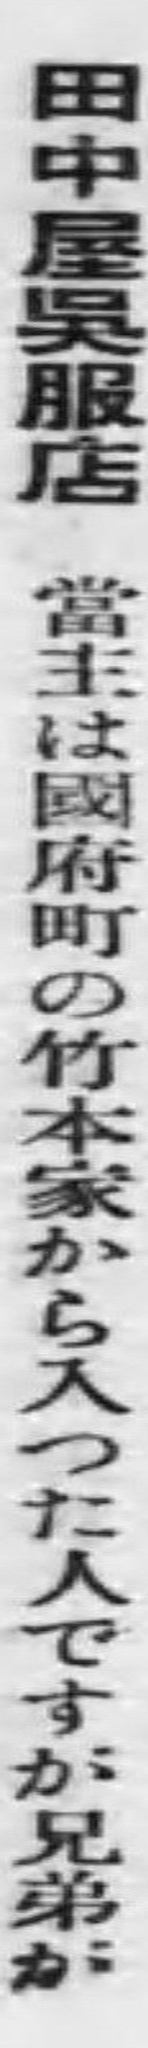田中屋呉服店当主は国府町の竹本家から入つた人ですが兄弟が
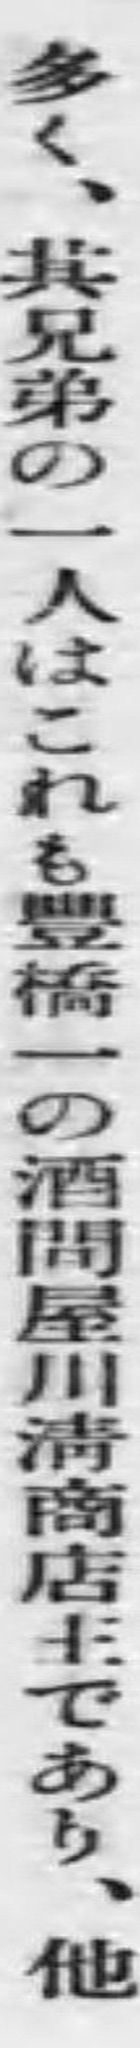多く、其兄弟の一人はこれも豊橋一の酒問屋川清商店主であり、他
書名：東三河道中記 : 豊橋市及其附近案内
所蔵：国立国会図書館 National Diet Library, JAPAN
